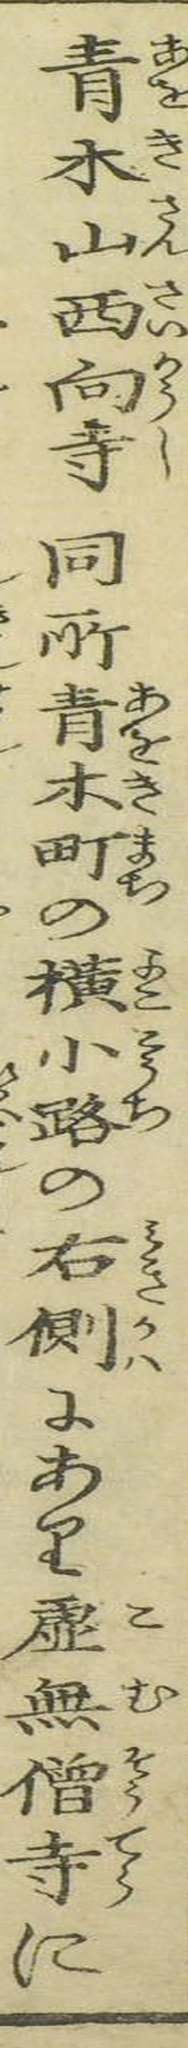青木山西向寺同所青木町の横小路の右側にあり虚無僧寺に
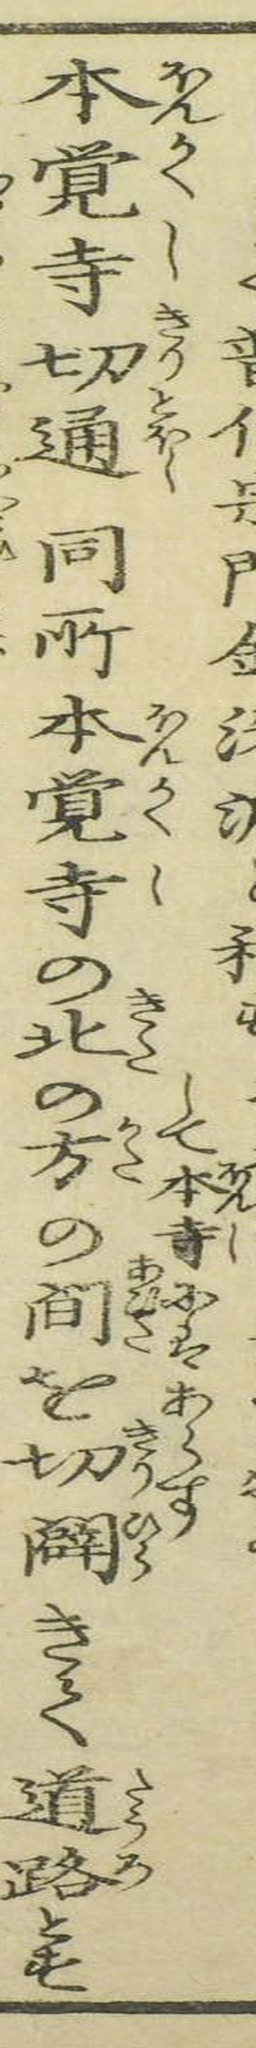本覚寺切通同所本覚寺の北の方の間を切闢きて道路とす
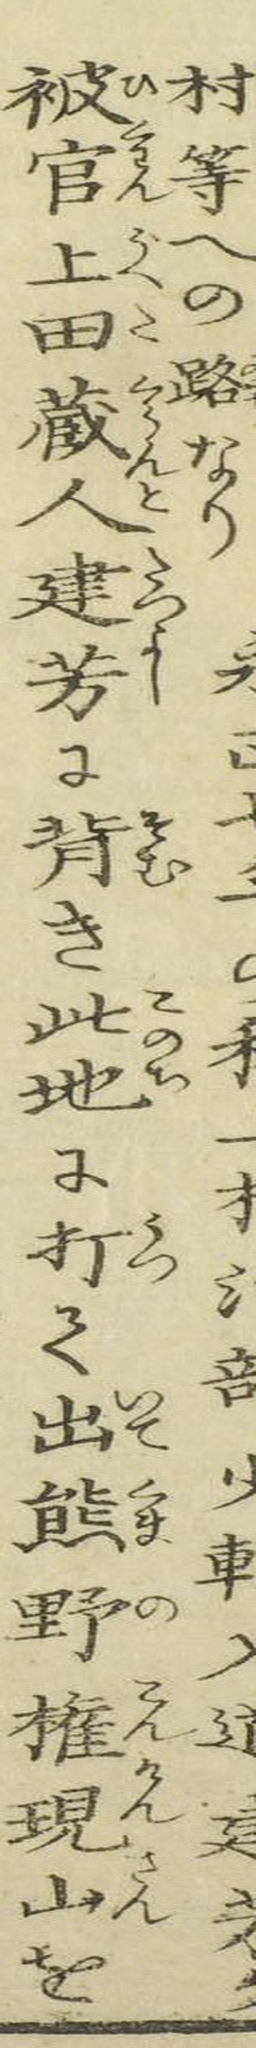被官上田蔵人建芳に背き此地に打て出熊野権現山を
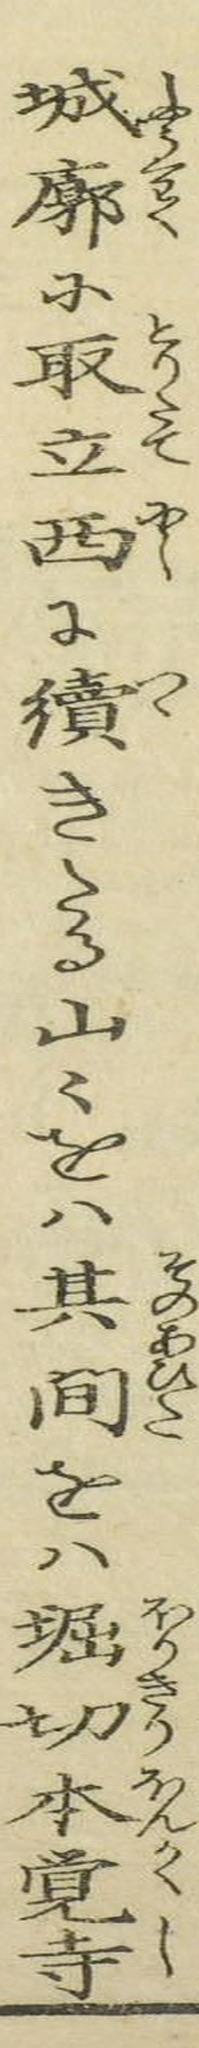城郭に取立西に續きたる山々をは其間をは堀切本覚寺
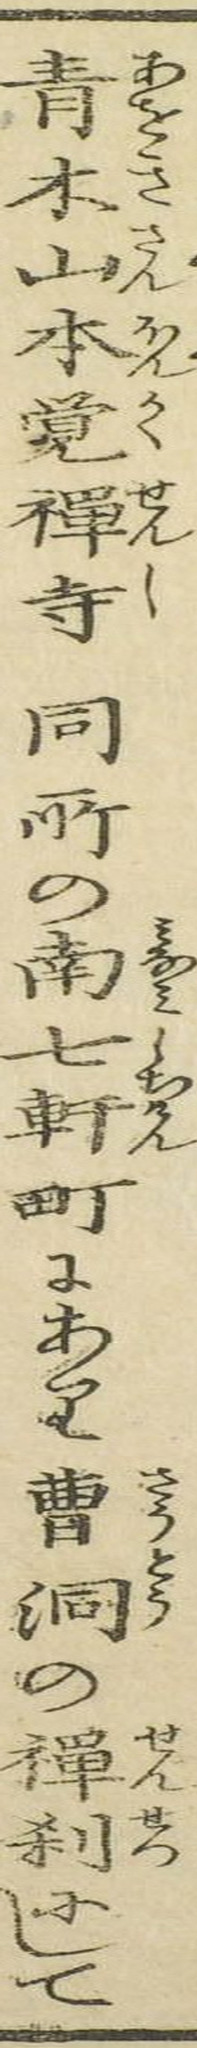青木山本覚禅寺同所の南七軒町にあり曹洞の禅刹にして
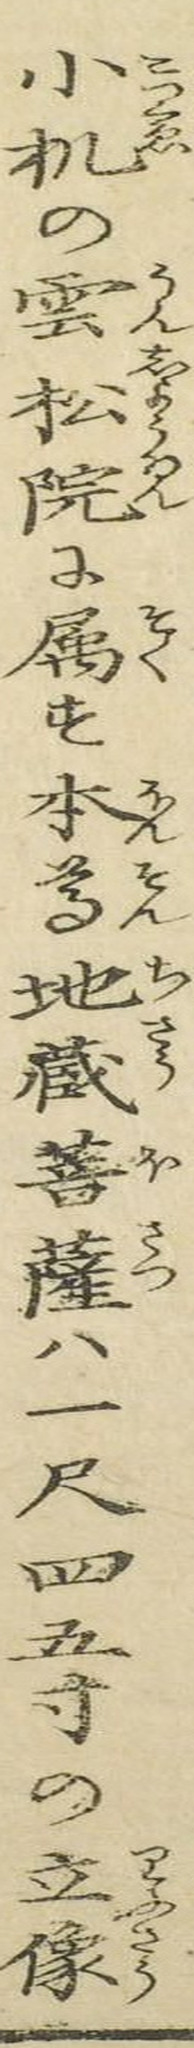小机の雲松院に属す本尊地蔵菩薩は一尺四五寸の立像
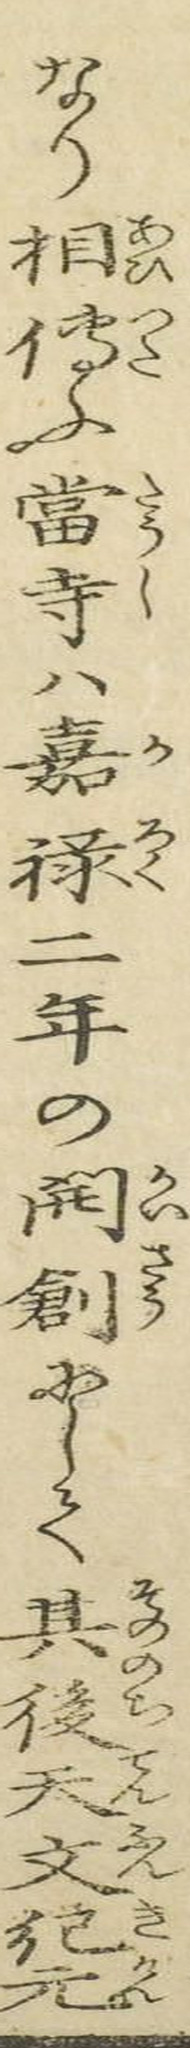なり相傳ふ當寺は嘉禄二年の開創にして其後天文紀元
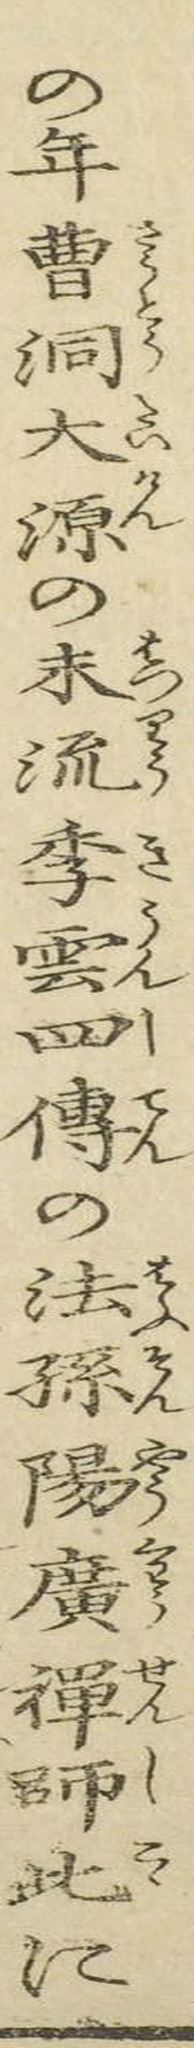の年曹洞大源の末流季雲四傳の法孫陽廣禅師此に
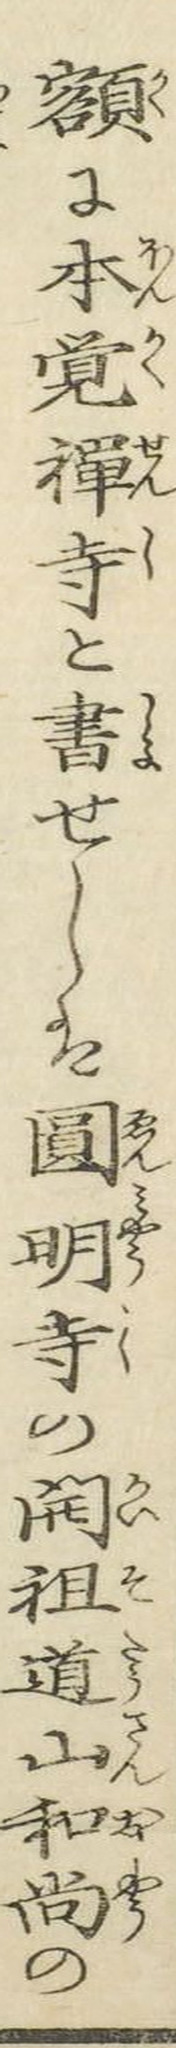額に本覚禅寺と書せしは圓明寺の開祖道山和尚の
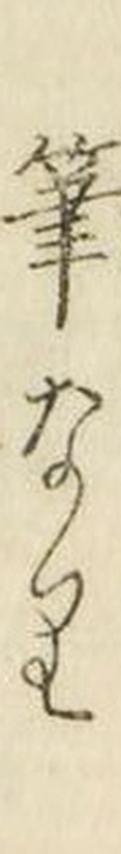筆なり
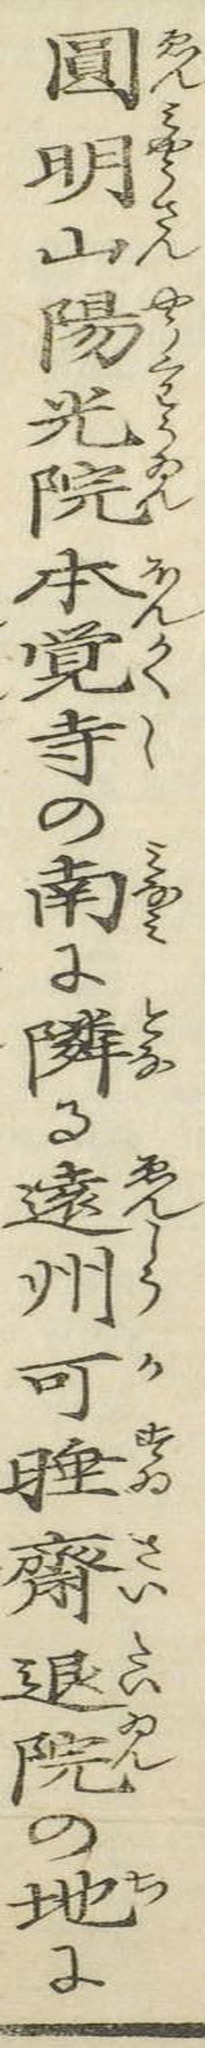圓明山陽光院本覚寺の南に隣る遠州可睡齋退院の地に
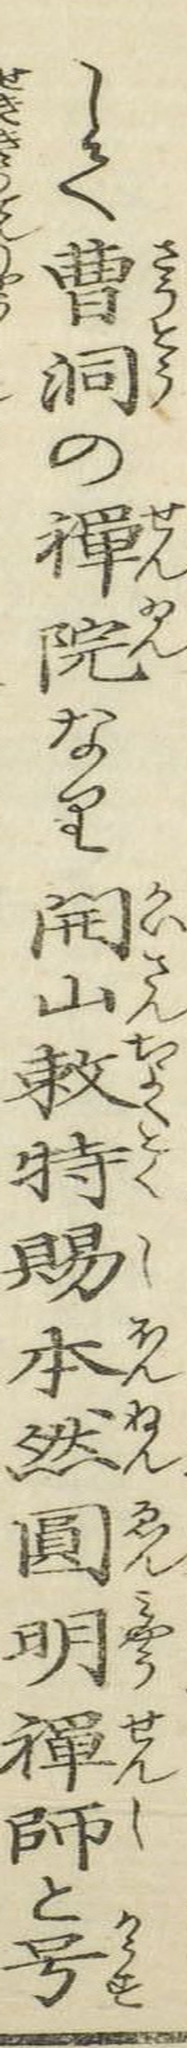して曹洞の禅院なり開山勅特賜本然圓明禅師と号
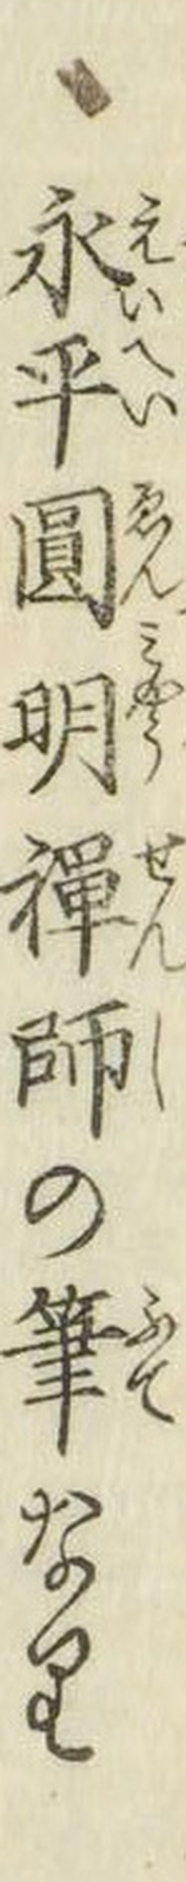永平圓明禅師の筆なり
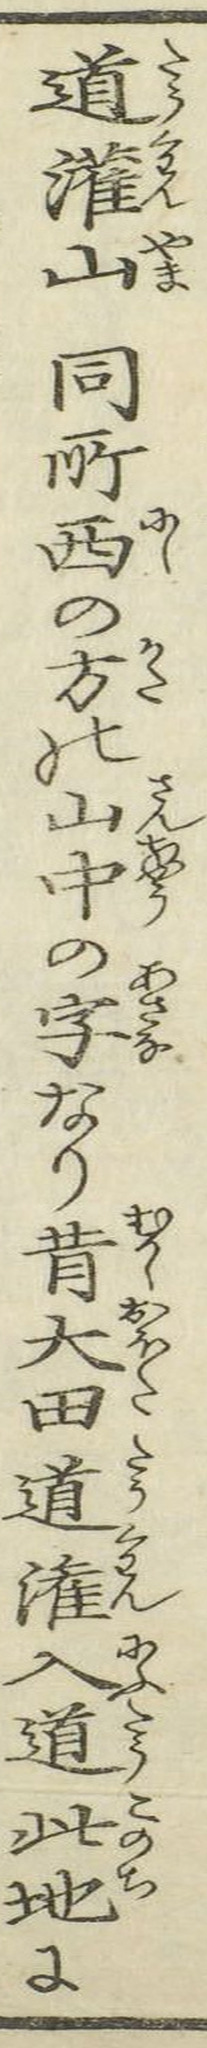道灌山同所西の方の山中の字なり昔大田道灌入道此地に
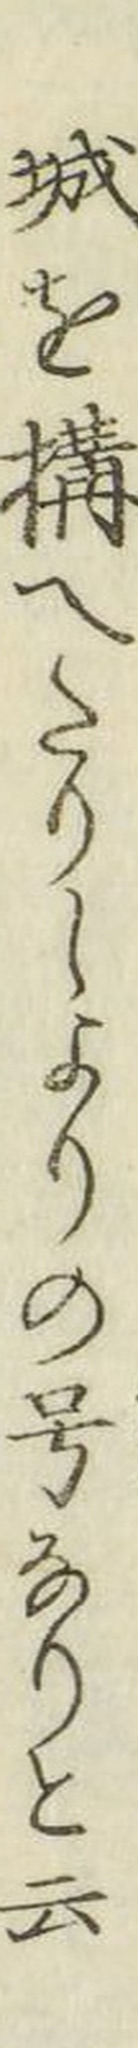城を構へたりしよりの号なりと云
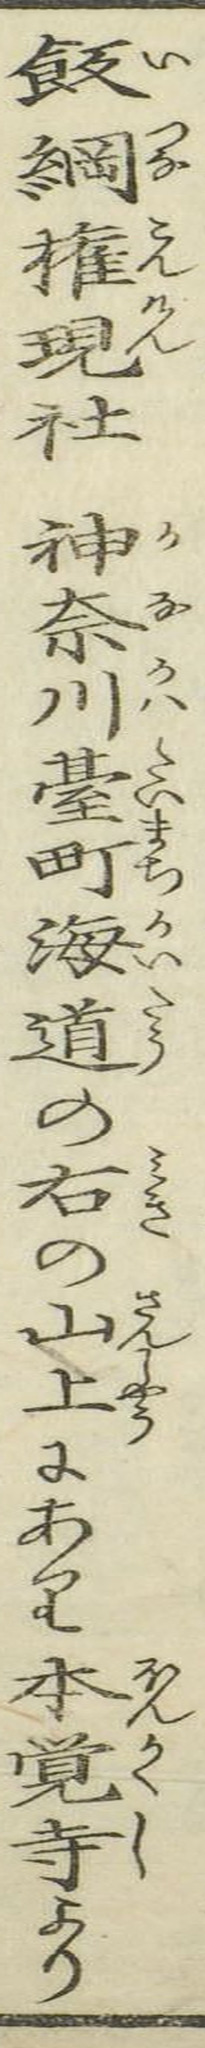飯綱権現社神奈川臺町海道の右の山上にあり本覚寺より
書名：江戸名所図会 20巻 巻之5
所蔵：東京学芸大学教育コンテンツアーカイブ
